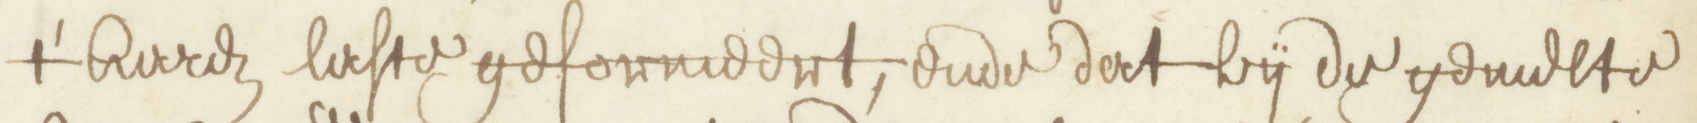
t‛ haren laste geformeert, ende dat bij de gemelte
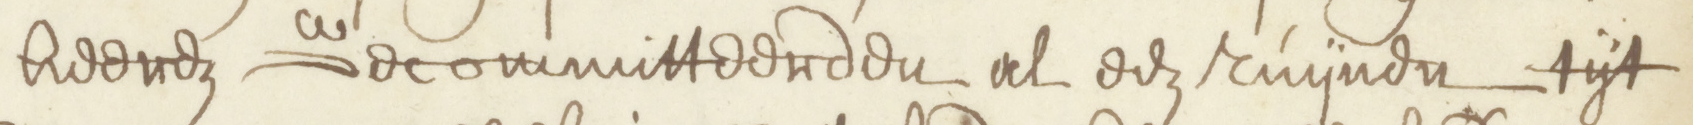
heeren Gecommitteerden al een ruijnen tijt
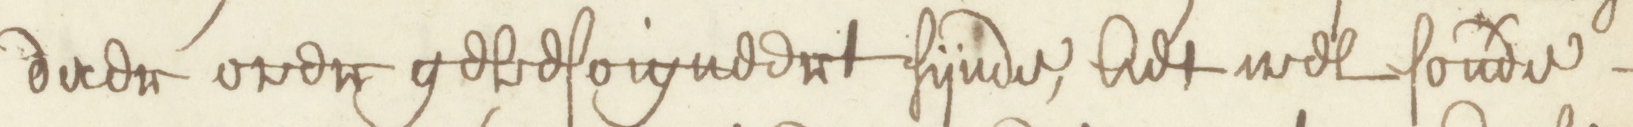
daer over gebesoigneert sijnde, het wel soude
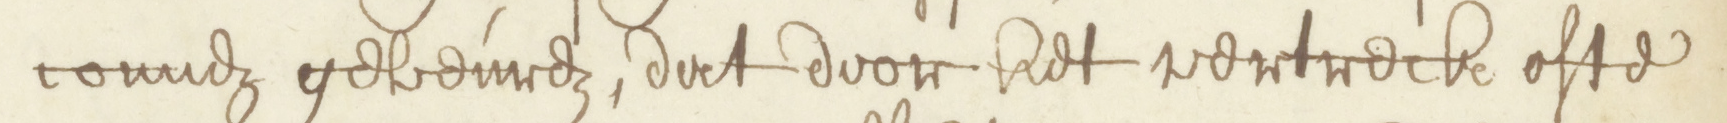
connen gebeuren, dat door het vertreck ofte
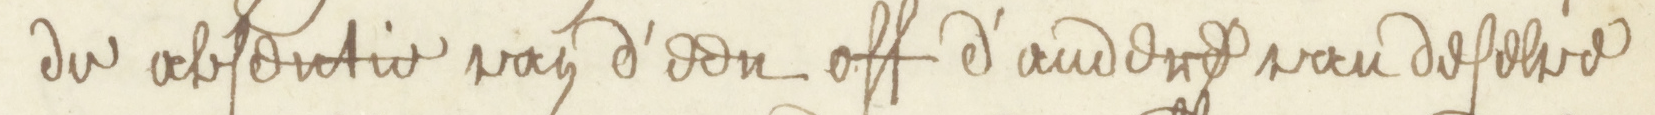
de absentie van d‛een off d'andere van deselve
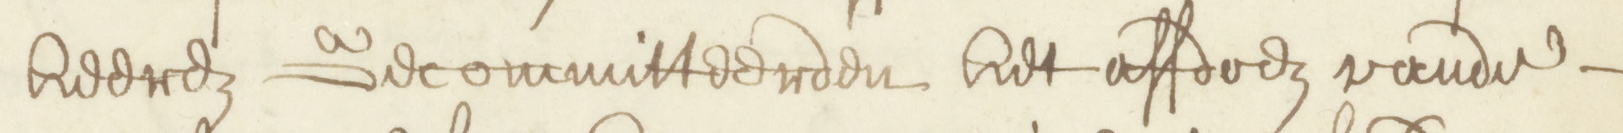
heeren Gecommitteerden het affdoen vande
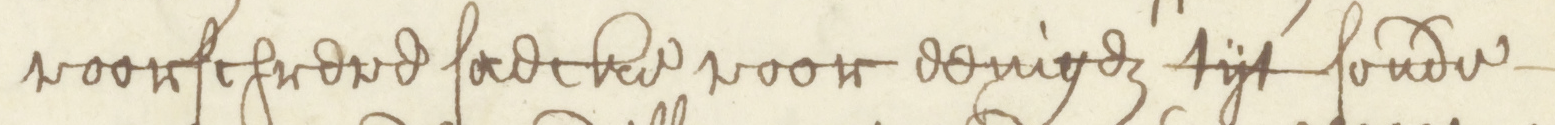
voorschreve saecke voor eenigen tijt soude
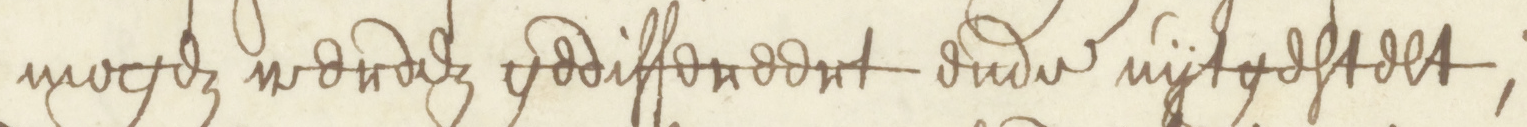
mogen werden gediffereert ende uijtgestelt,
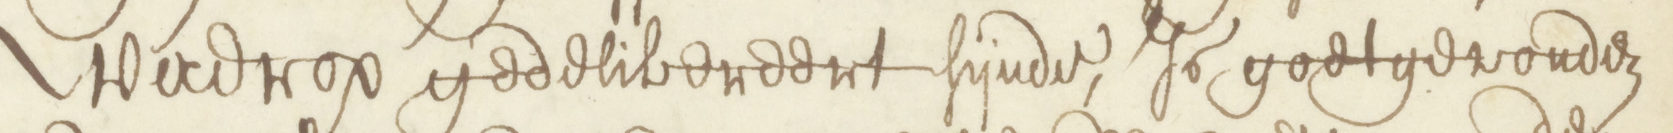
Waerop gedelibereert sijnde, Is goetgevonden
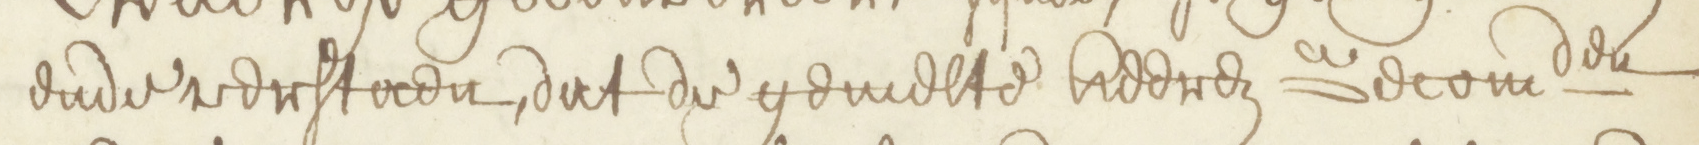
ende verstaen, dat de gemelte heeren Gecomden
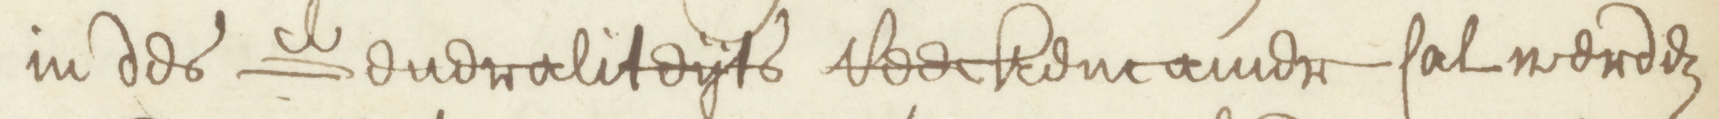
in des Generaliteijts Reeckencamer sal werden
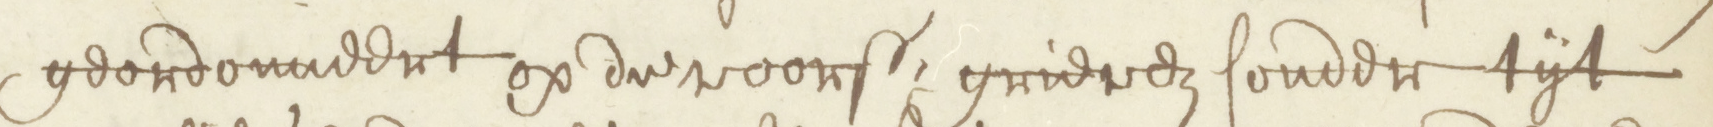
geordonneert op de voors. grieven sonder tijt
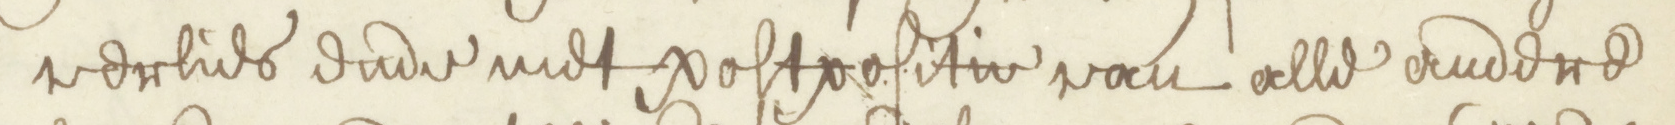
verlies ende met postpositie van alle andere
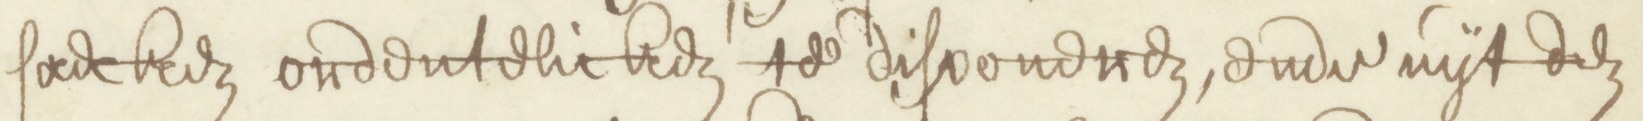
saecken ordentelicken te disponeren, ende uijt den
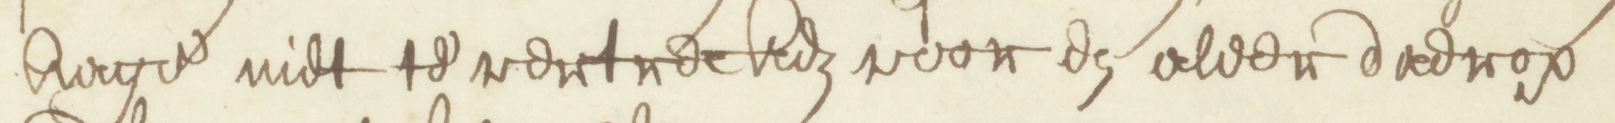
hage niet te vertrecken voor de aleer daerop
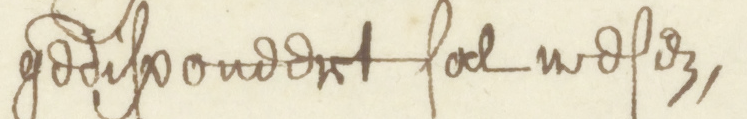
gedispondert sal wesen,
